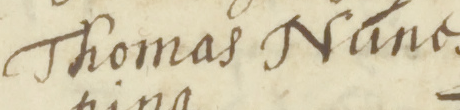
Thomas Nunes
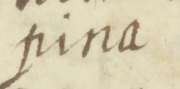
pina
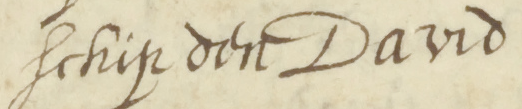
schip den David
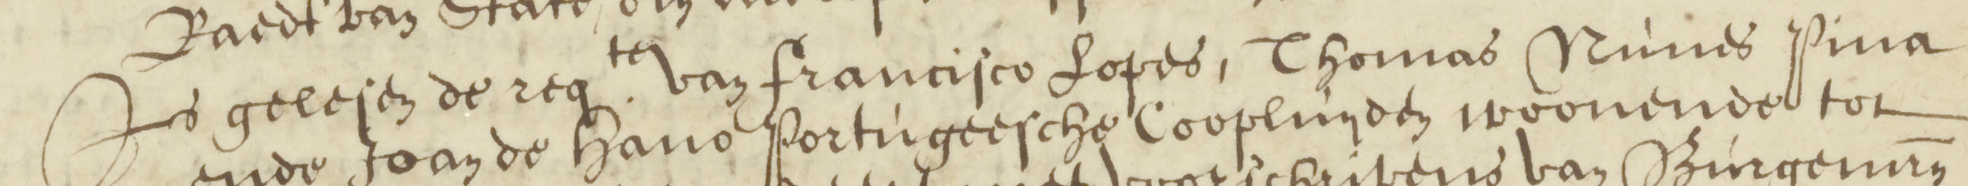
Is gelesen de reqte. van francisco Lopes, Thomas Nunes Pina
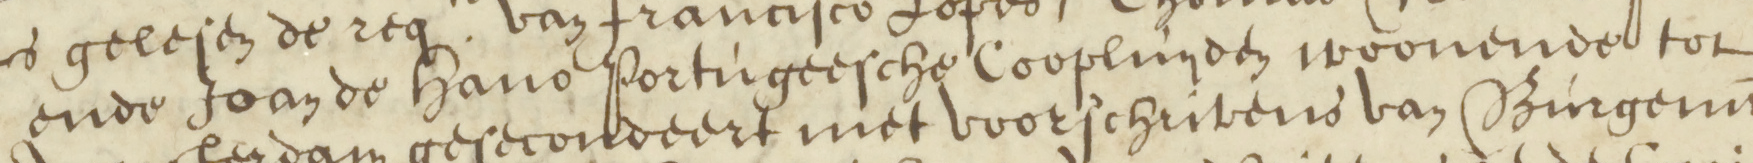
ende Joan de Hano Portugeesche Coopluyden woonende tot
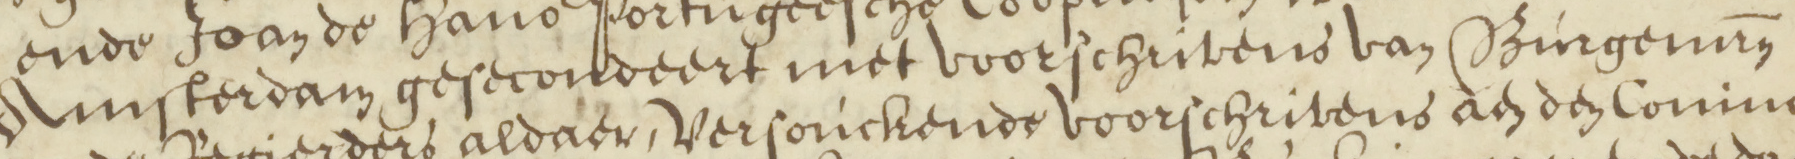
Amsterdam gesecondeert met voorschrivens van Burgemrn
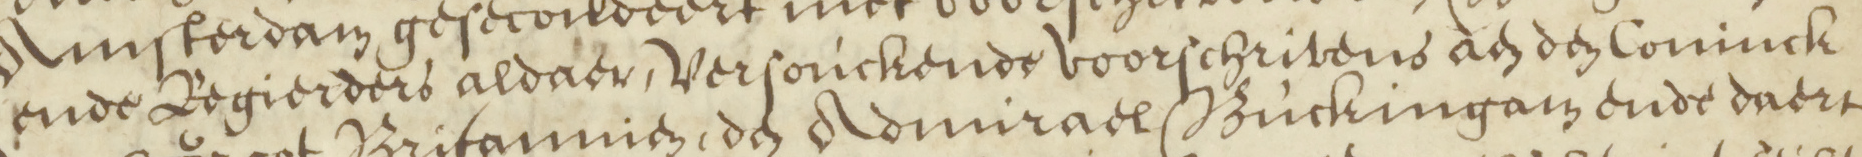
ende Regierders aldaer, Versouckende voorschrivens aen den Coninck
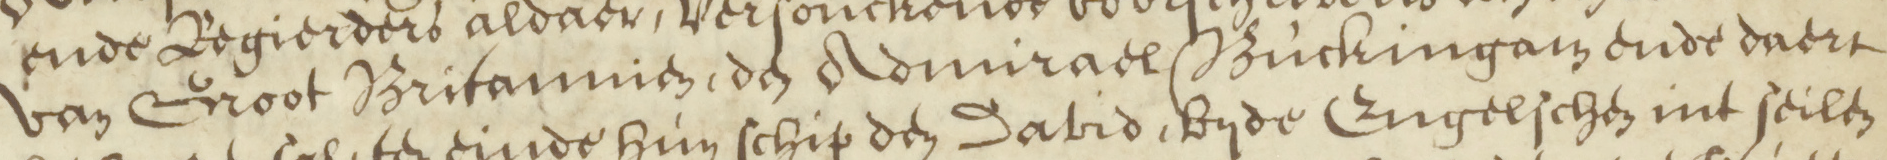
van Groot Britannien, den Admirael Buckingam ende daert
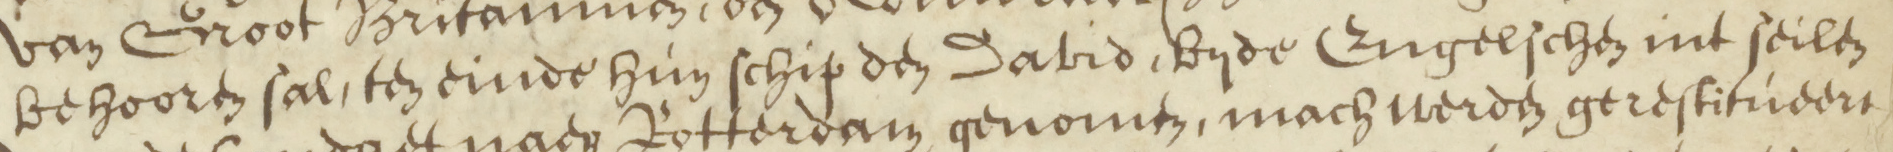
behooren sal, ten einde hun schip den David, byde Engelschen int seilen
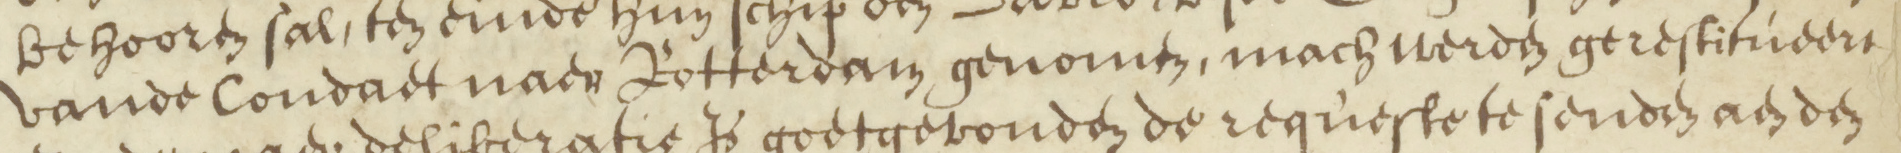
vande Condaet naer Rotterdam genomen, mach werden gerestitueert
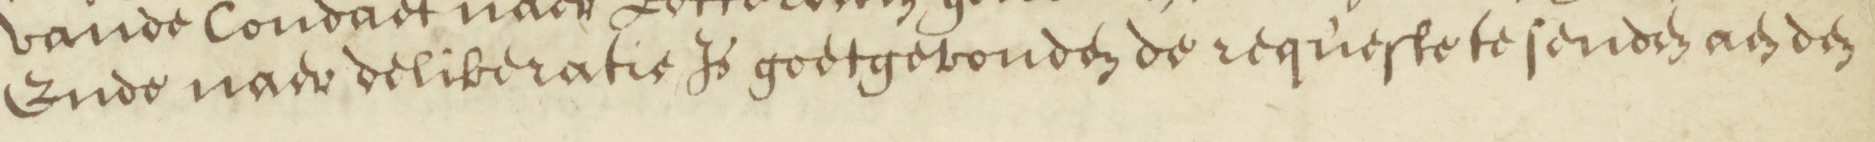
Ende naer deliberatie Is goetgevonden de requeste te senden aen den
